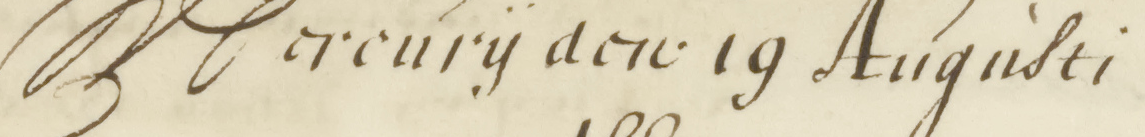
Mercurij den 19 Augusti
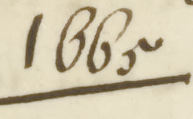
1665
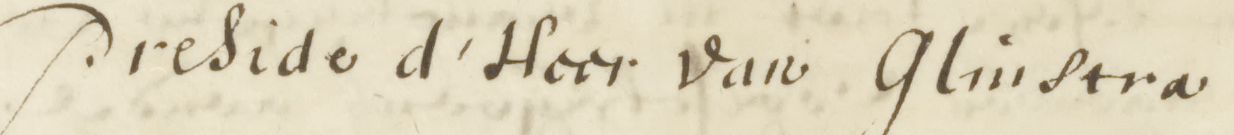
Preside d'Heer van Glinstra,
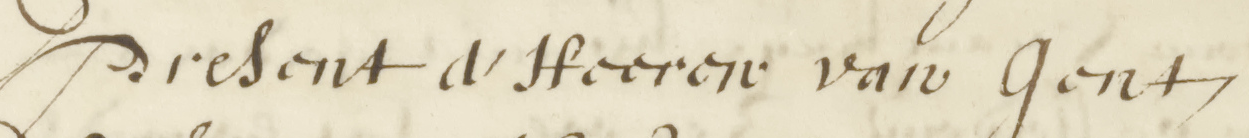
Present d'Heeren van Gent,
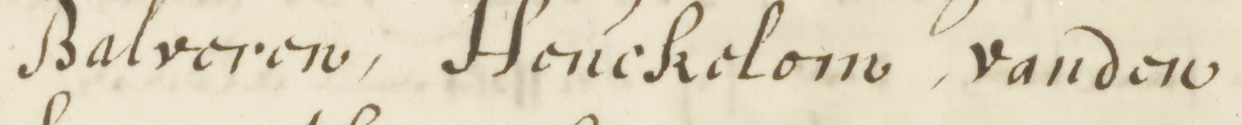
Balveren, Heuckelom, vanden
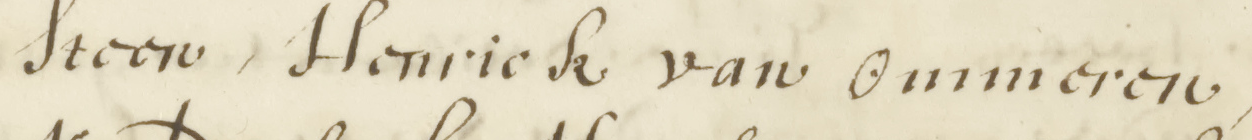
Steen, Henrick van Ommeren,
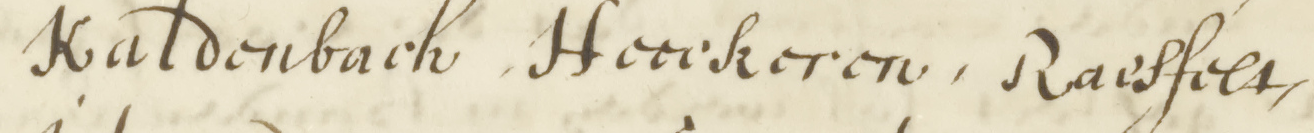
Kaldenbach, Heeckeren, Raesfelt,
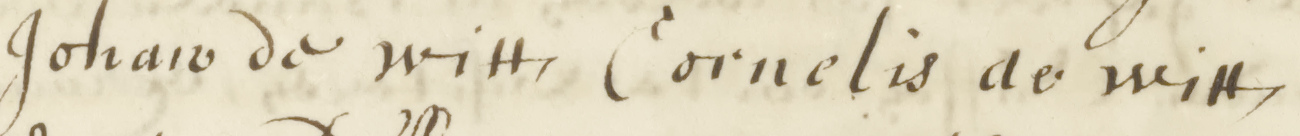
Johan de Witt, Cornelis de Witt,
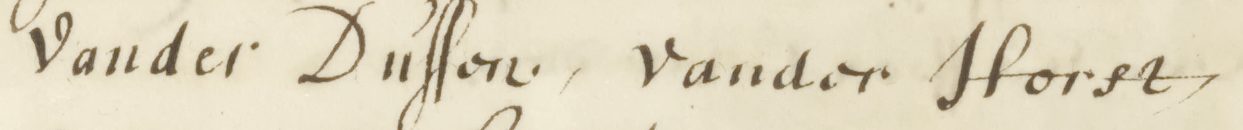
van der Dussen, van der Horst,
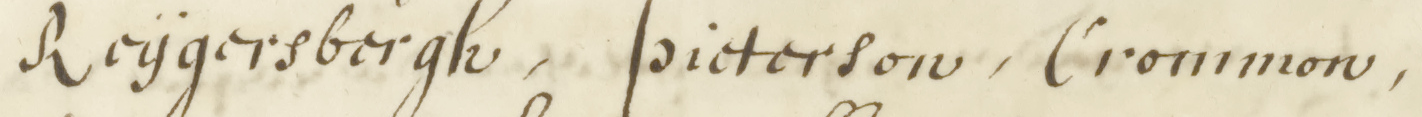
Reijgersbergh, Pieterson, Crommon,
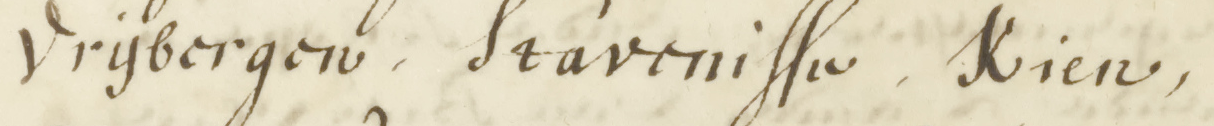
Vrijbergen, Stavenisse, Kien,
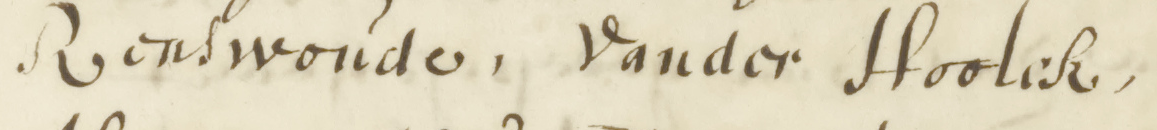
Renswoude, Van der Hoolck,
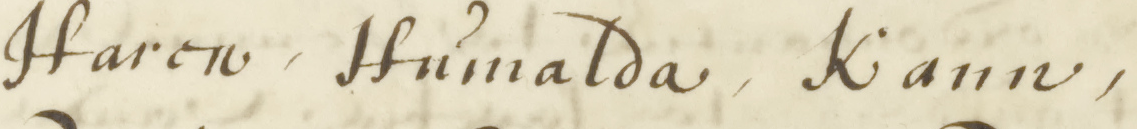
Haren, Humalda, Kann,
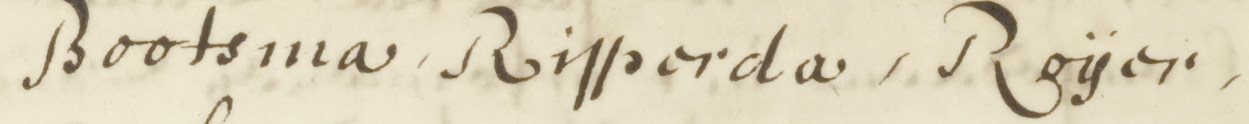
Bootsma, Ripperda, Roijer,
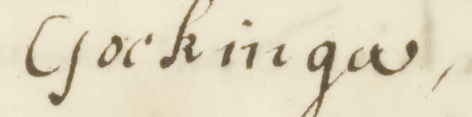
Gockinga.
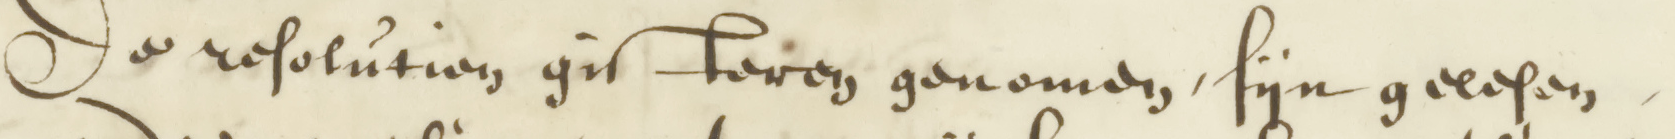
De resolutien gisteren genomen, sijn gelesen
